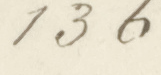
136
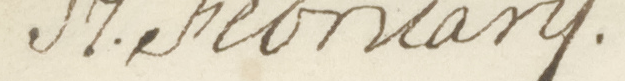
17. Februarij.
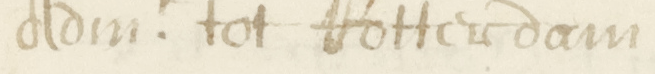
Admt. tot Rotterdam
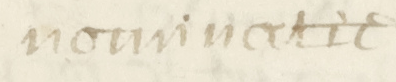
nominatie
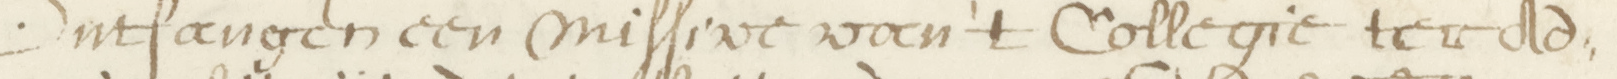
Ontfangen een missive van 't Collegie ter Ad,,
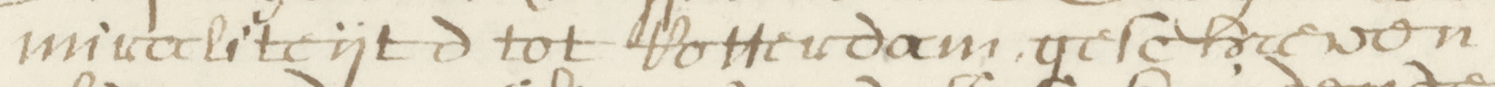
miraliteijt d tot Rotterdam, geschreven
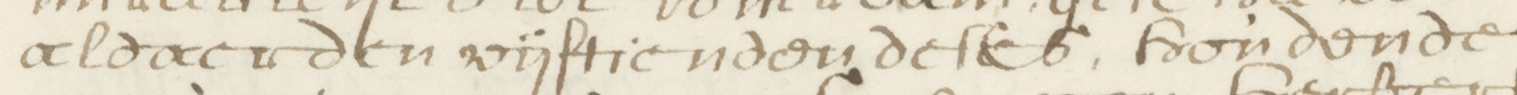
aldaer den vijftienden deses, houdende
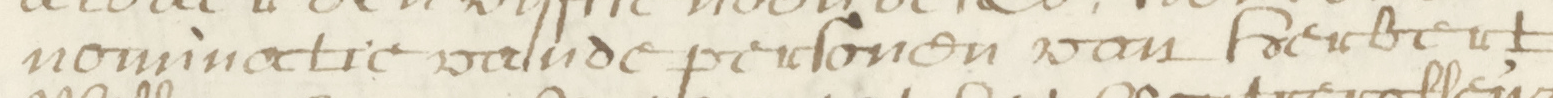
nominatie vande personen van herbert
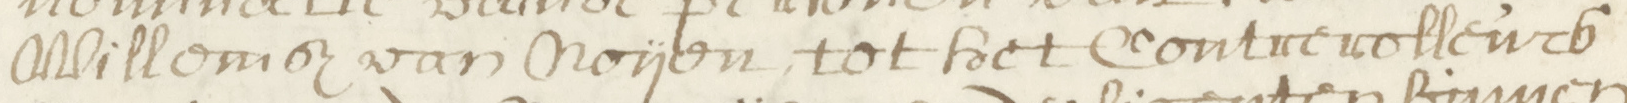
Willemsz van Noijen, tot het Contrerolleurs
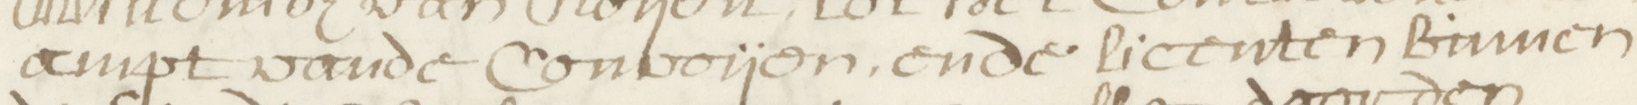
ampt vande Convoijen, ende licenten binnen
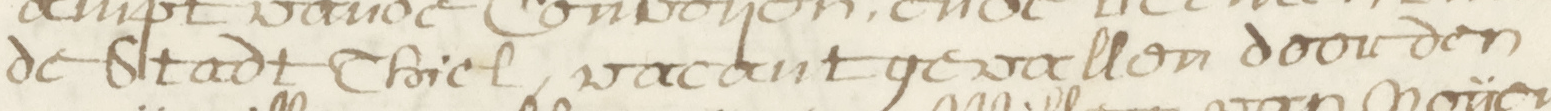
de Stadt Thiel, vacant gevallen door den
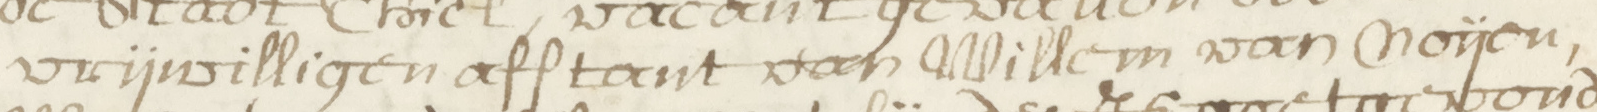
vrijwilligen afstant van Willem van Noijen.
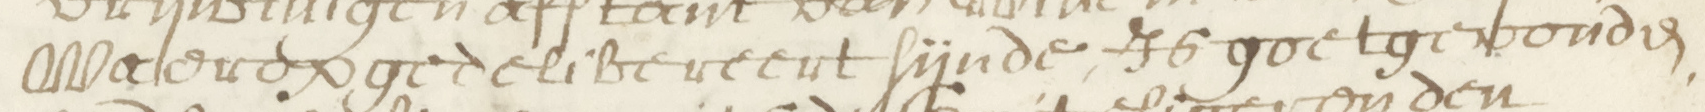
Waerop gedelibereert sijnde, Is goetgevonden,
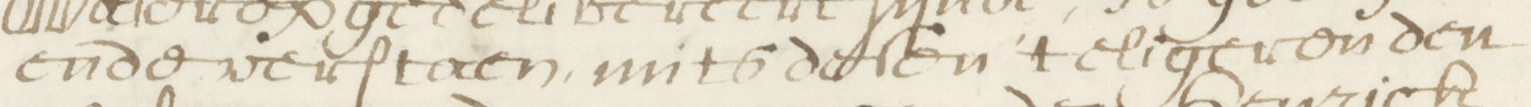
ende verstaen, mits desen 't eligeren den
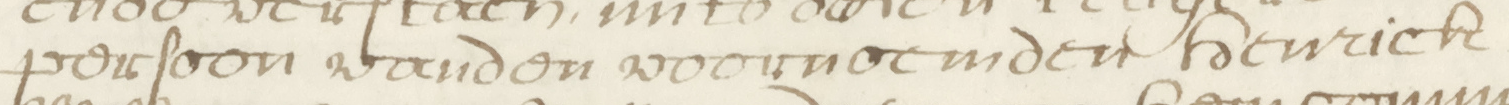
persoon vanden voornoemden henrick
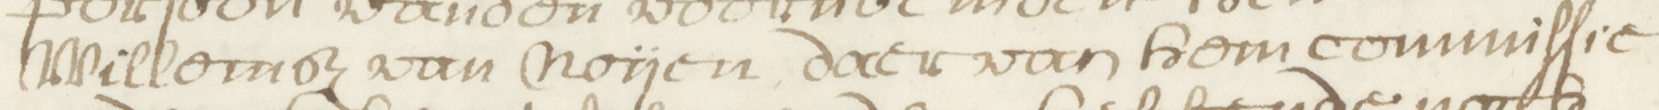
Willemsz van Noijen daer van hem commissie
